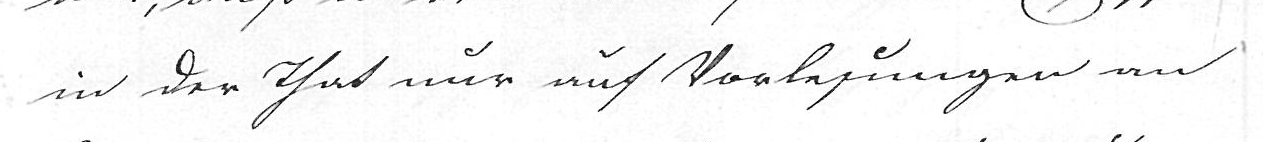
in der That nur auf Vorlesungen an
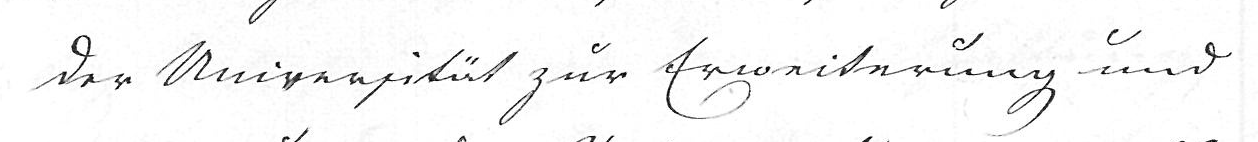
der Universität zur Erweiterung und
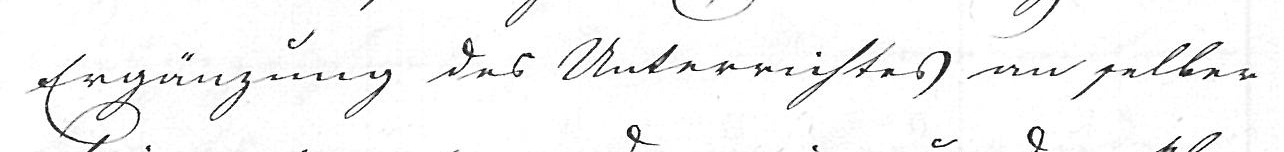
Ergänzung des Unterrichtes an selber
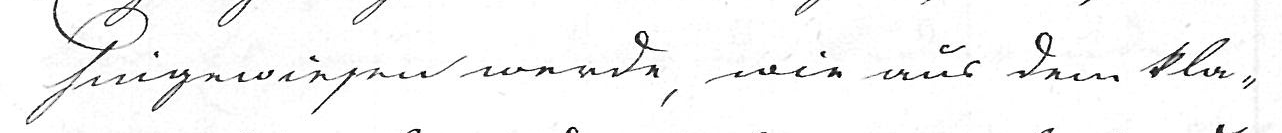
hingewiesen werde, wie aus dem kla-
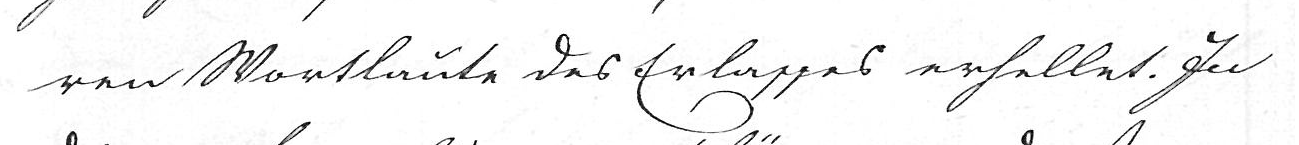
ren Wortlaute des Erlasses erhellet. In
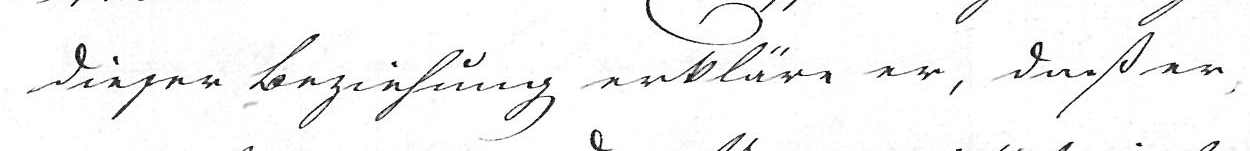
dieser Beziehung erkläre er, daß er
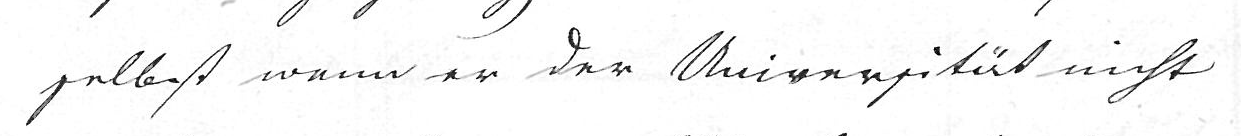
selbst wenn er der Universität nicht
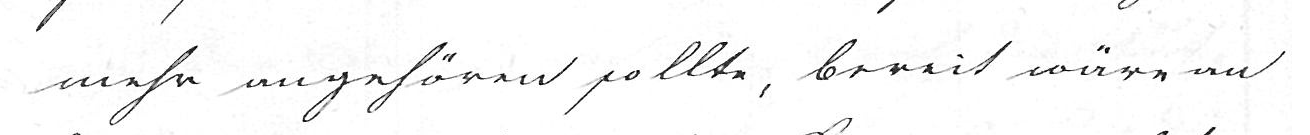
mehr angehören sollte, bereit wäre an
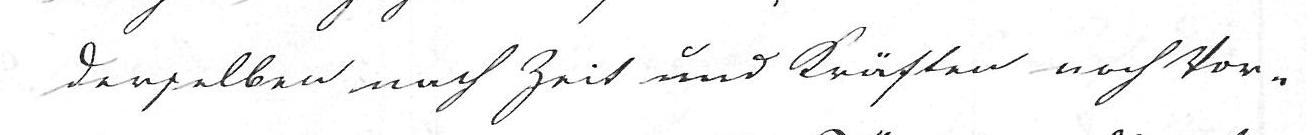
derselben nach Zeit und Kräften noch Vor-
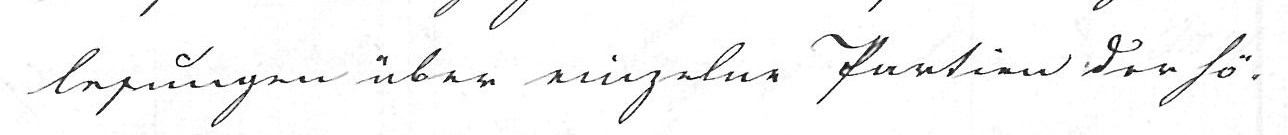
lesungen über einzelne Partien der hö-
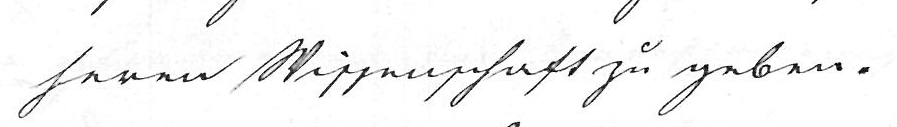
heren Wissenschaft zu geben.
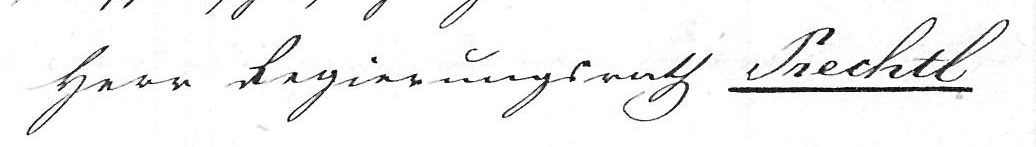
Herr Regierungsrath Prechtl
